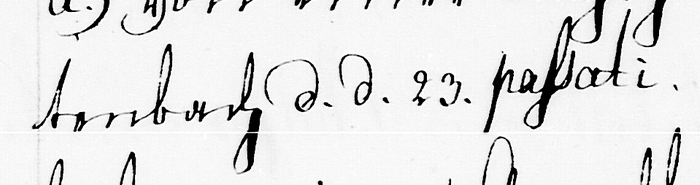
tenbach d. d. 23. passati.
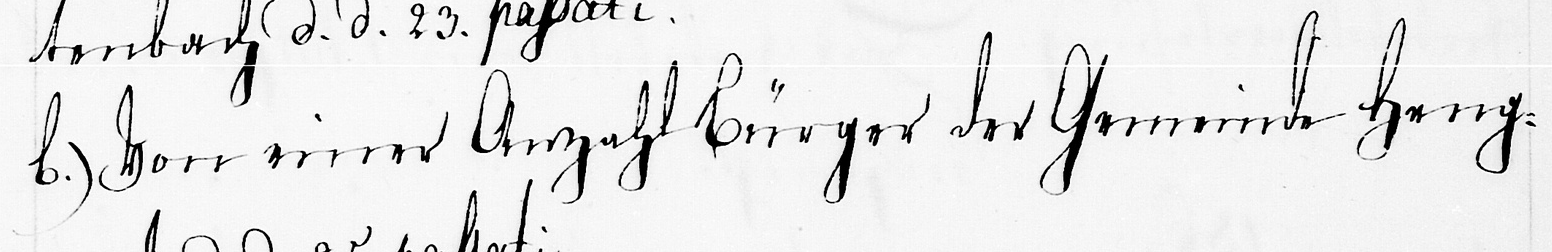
b.) Von einer Anzahl Bürger der Gemeinde Heng¬
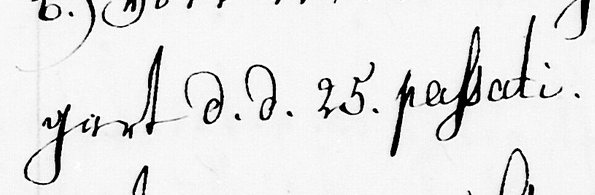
gart d. d. 25. passati.
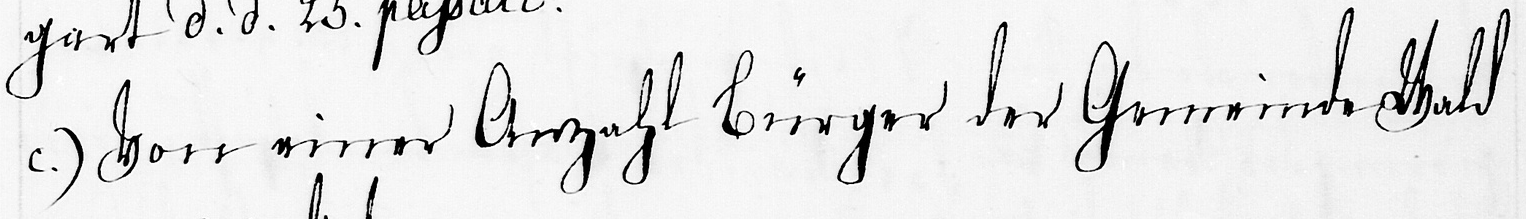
c.) Von einer Anzahl Bürger der Gemeinde Wald
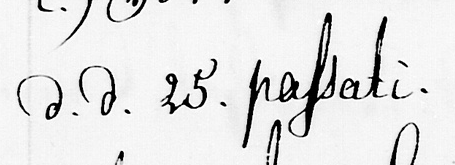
d. d. 25. passati.
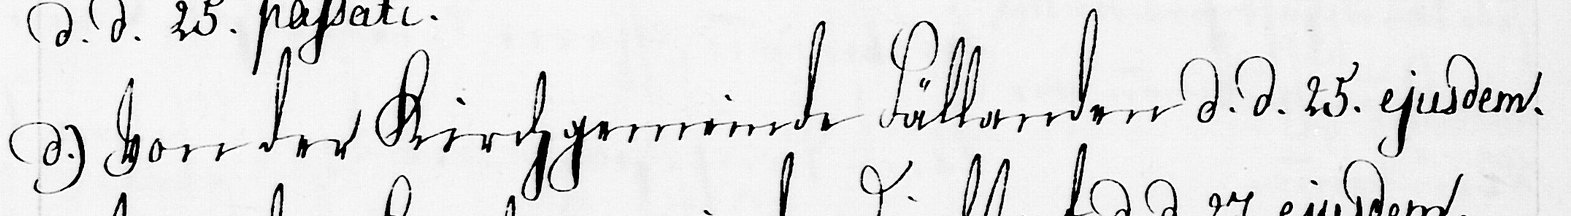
d.) Von der Kirchgemeinde Fällanden d. d. 25. ejusdem.
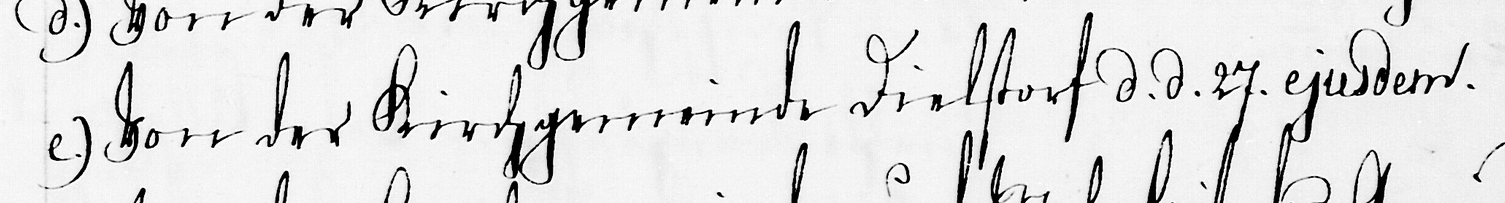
e.) Von der Kirchgemeinde Dielstorf d. d. 27. ejusdem.
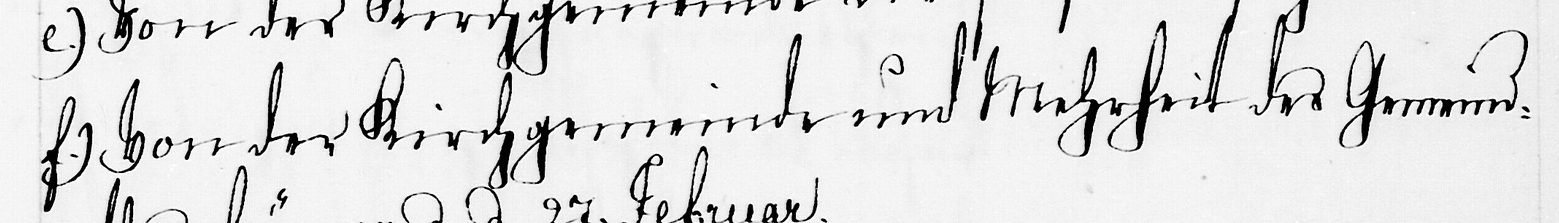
f.) Von der Kirchgemeinde und Mehrheit des Gemeind¬
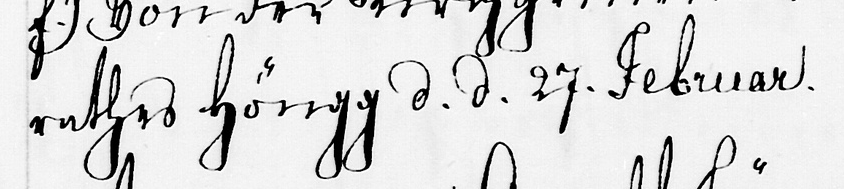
rathes Höngg d. d. 27. Februar.
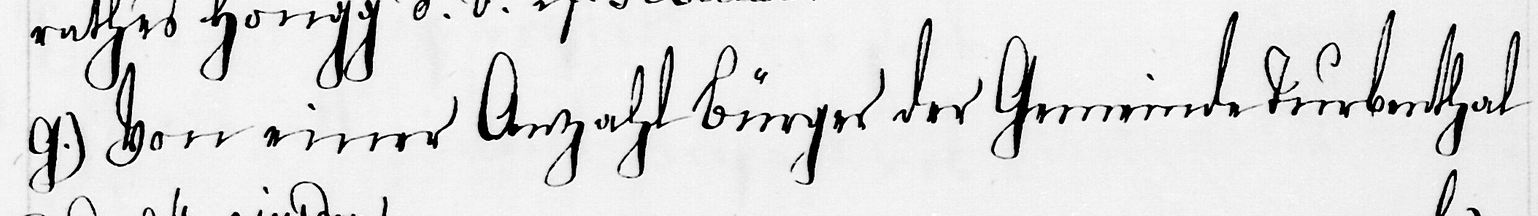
g.) Von einer Anzahl Bürger der Gemeinde Turbenthal
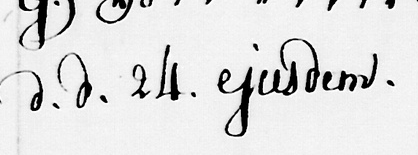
d. d. 24. ejusdem.
